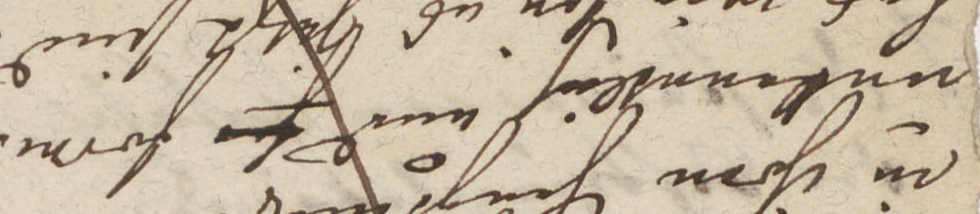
noch so wenig bekannt sind, und deren
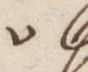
dieses
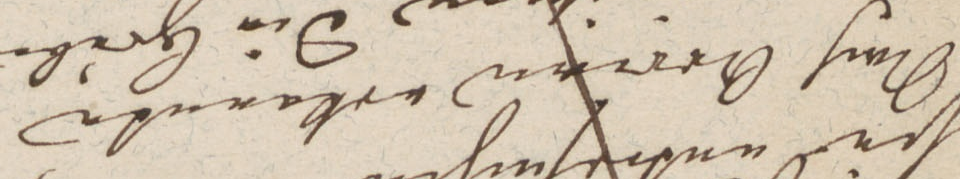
Er hatte den Plan zu ihr so ge-
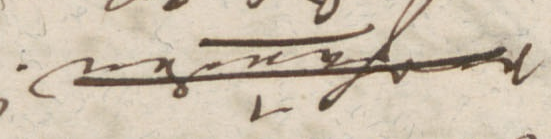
zu gewinnen und %
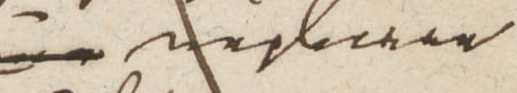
dieses Werkes begonnen
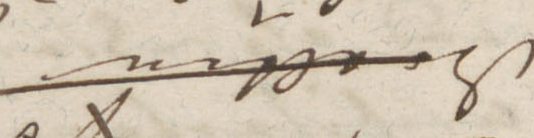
als er starb.
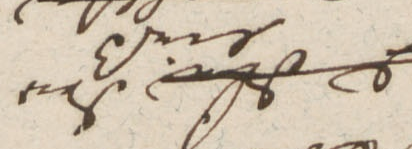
gleichzeitigen
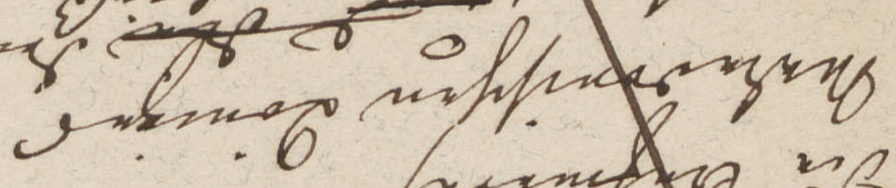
die seine Thaten bearbeiteten,
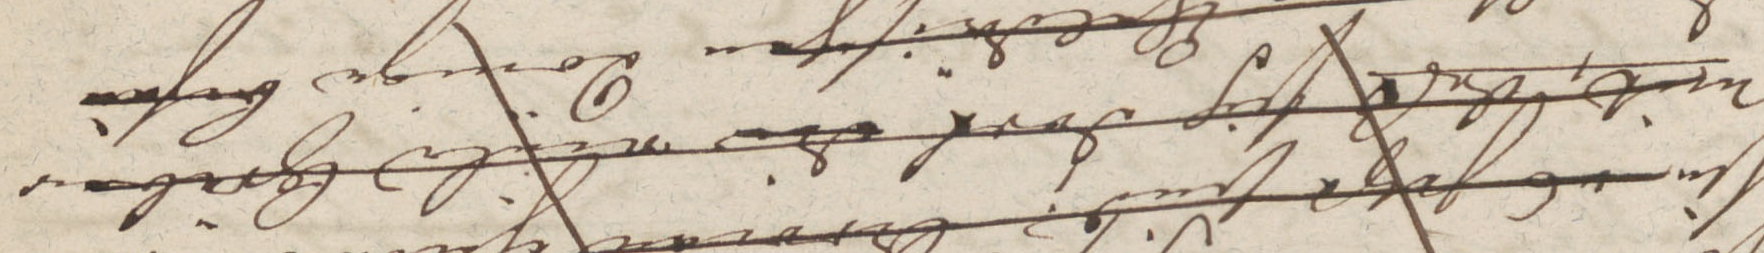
wir Weniges über die % Beschaffenheit
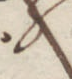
der
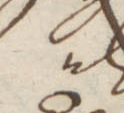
des
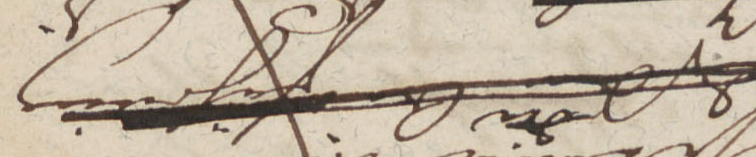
man in ihnen die Gräber
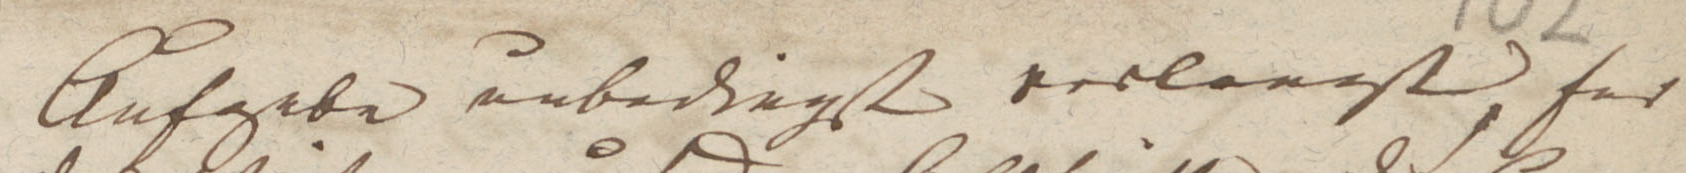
Aufgabe unbedingt verlangt, für
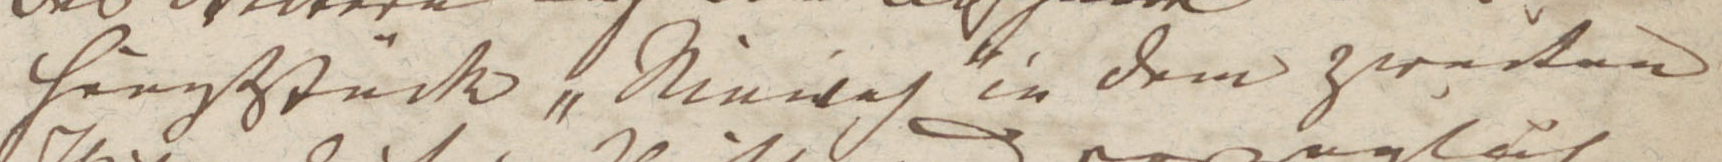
Hauptstück "Niniveh" in dem zweiten
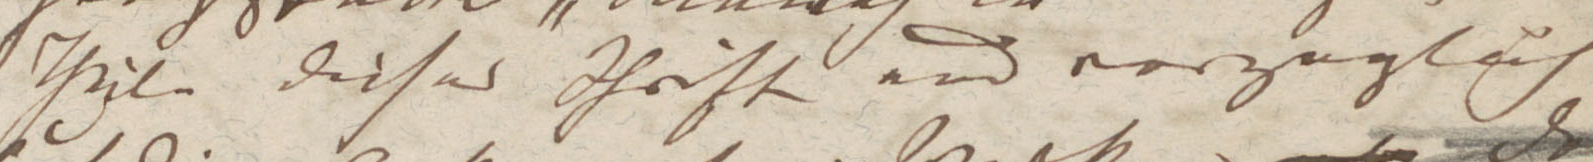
Theile dieser Schrift und vorzüglich
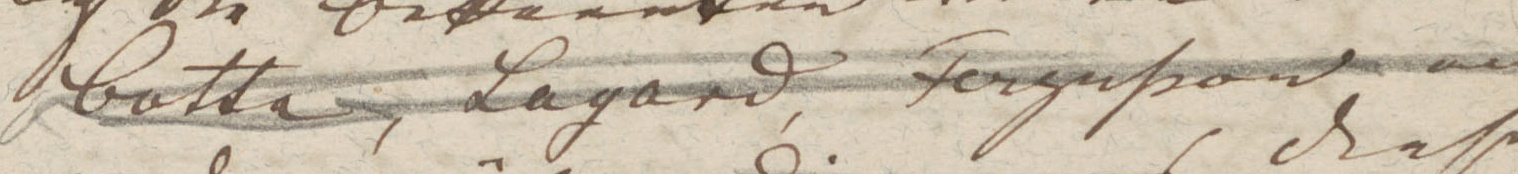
Botta, Layard, Fergusson und
